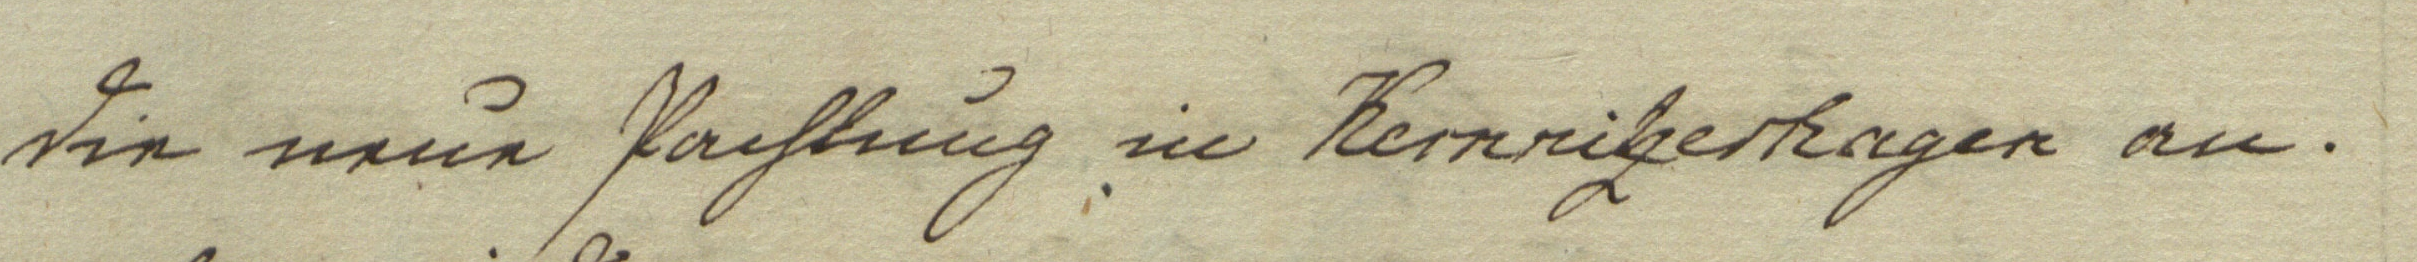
die neue Pachtung in Kemnitzerhagen an¬
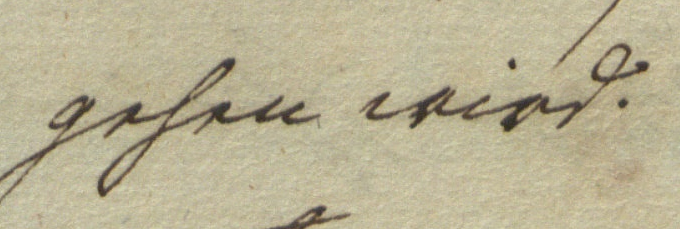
gehen wird.
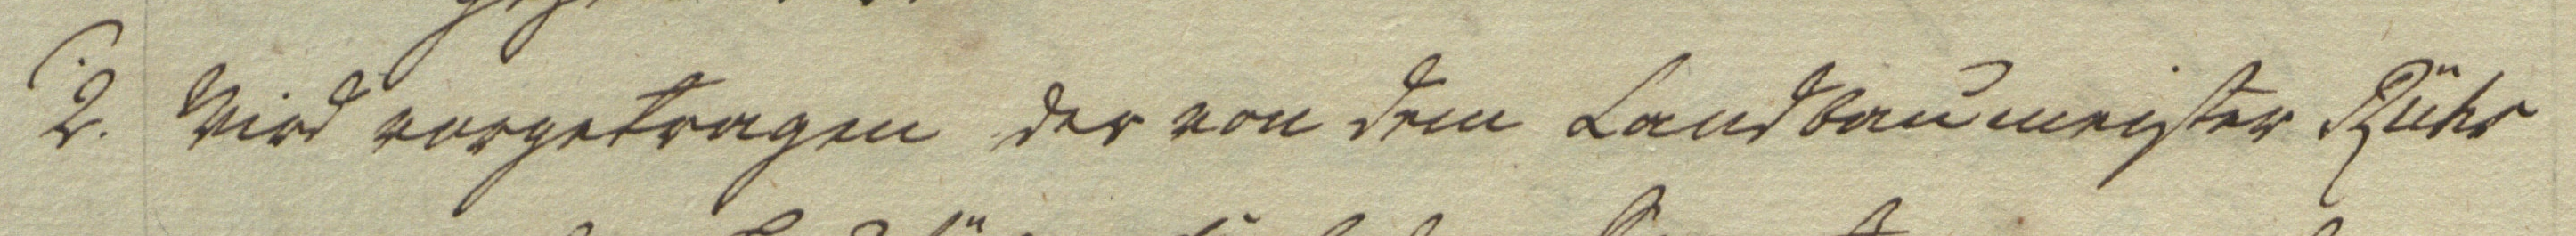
2. Wird vorgetragen der von dem Landbaumeister Rühs
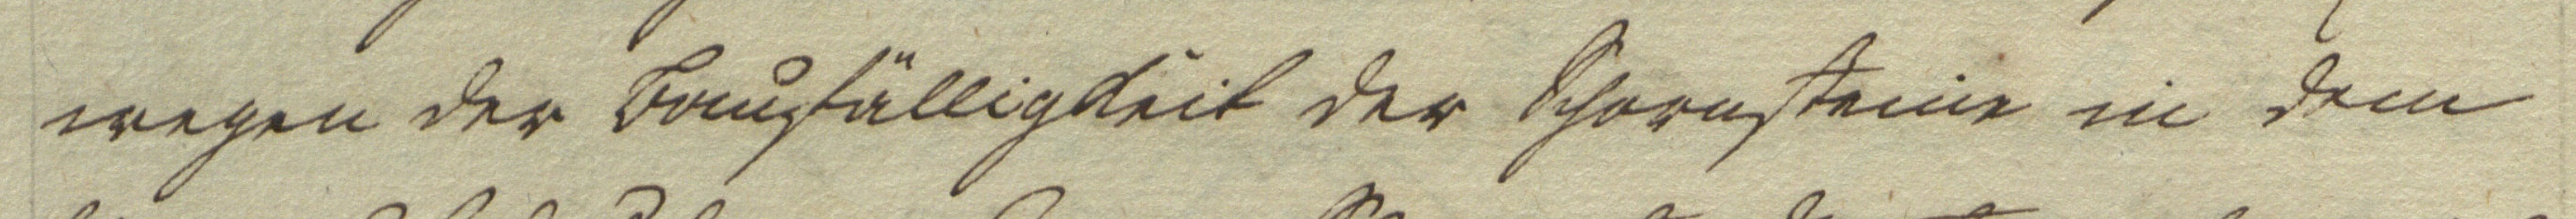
wegen der Baufälligkeit der Schornsteine in dem
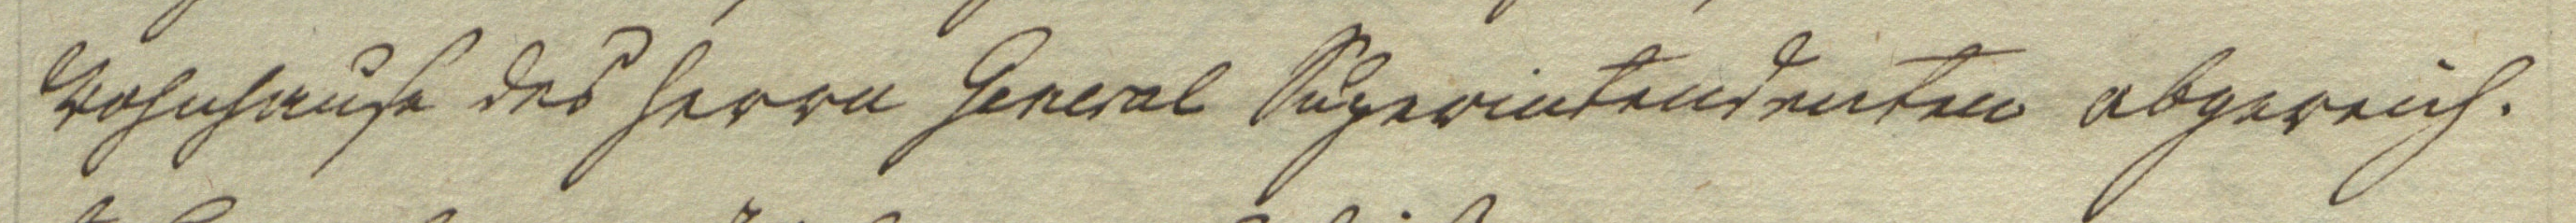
Wohnhause des Herrn General Superintendenten abgereich¬
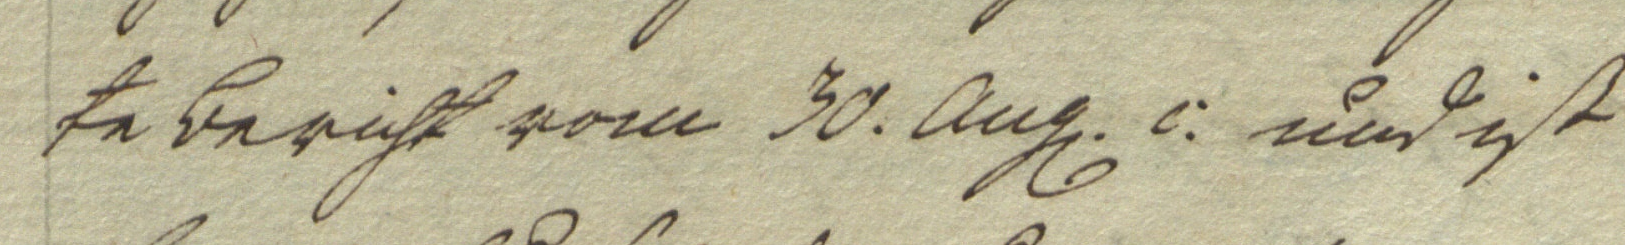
te Bericht vom 30. Aug. c. und ist
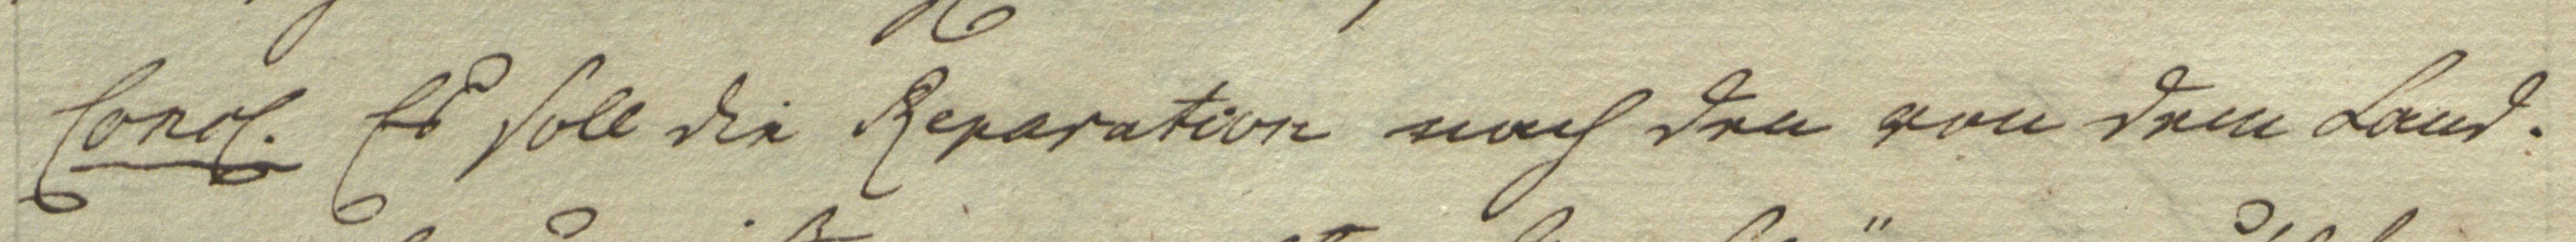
Concl. Es soll die Reparation nach den von dem Land¬
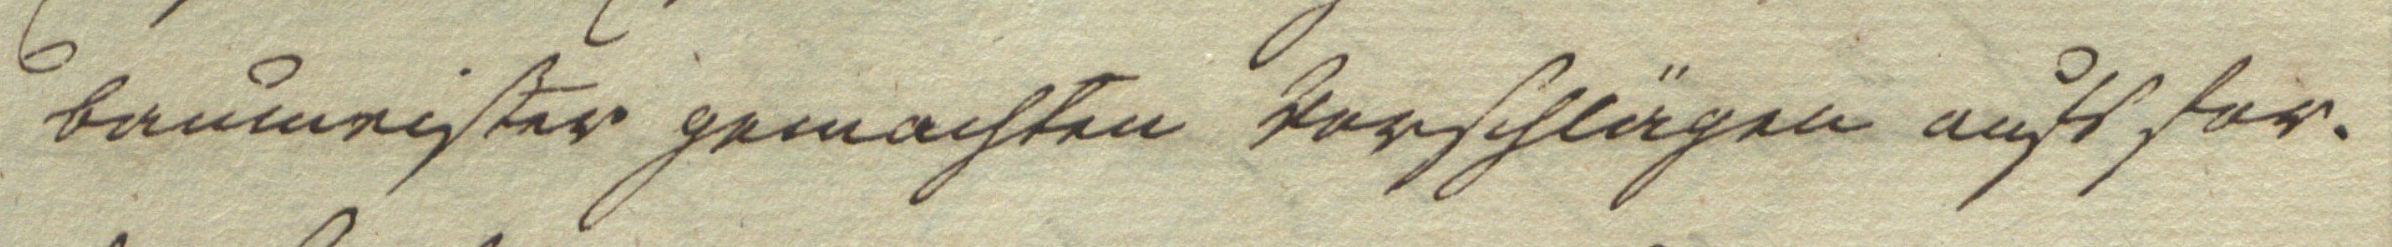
baumeister gemachten Vorschlägen aufs for¬
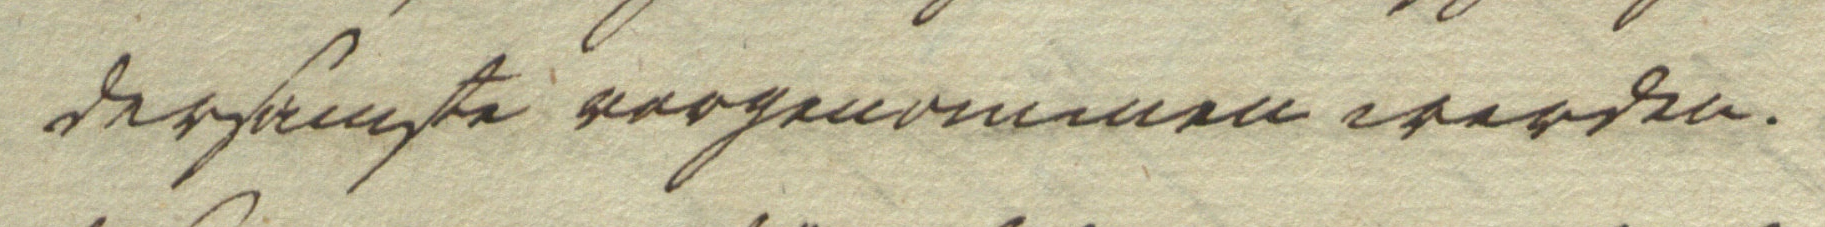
dersamste vorgenommen werden.
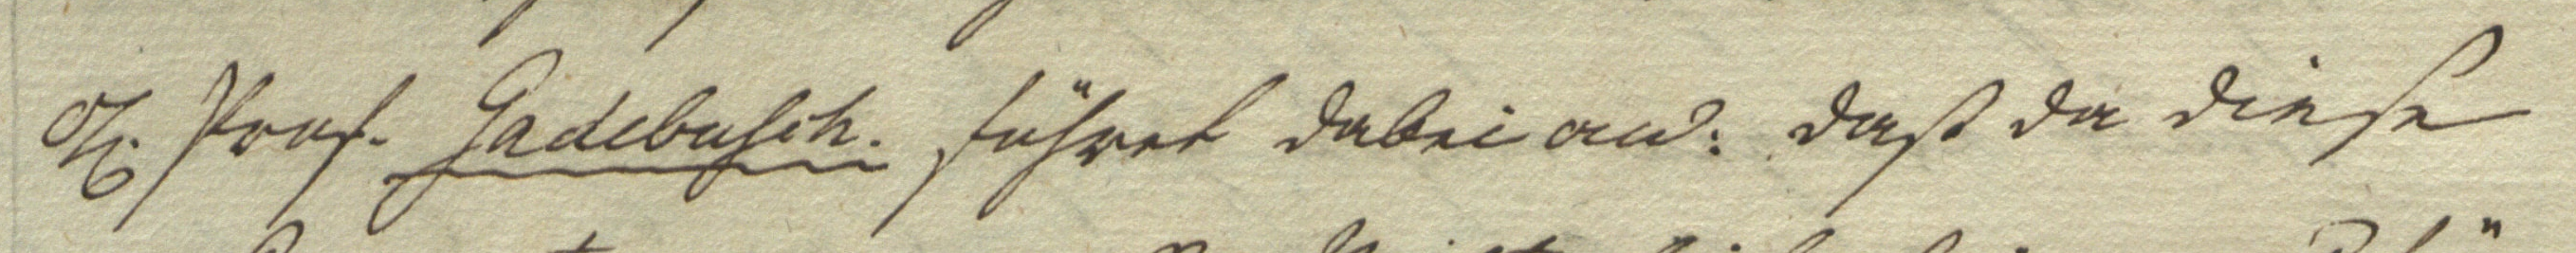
dh. Prof. Gadebusch. führet dabei an: daß da diese
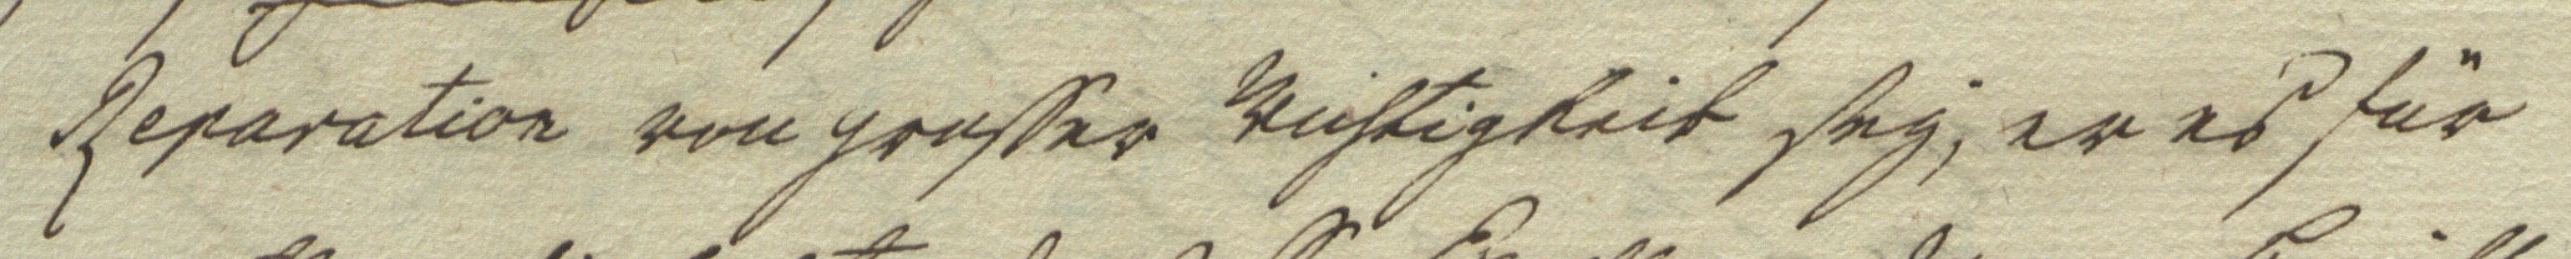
Reparation von grosser Wichtigkeit seÿ, er es für
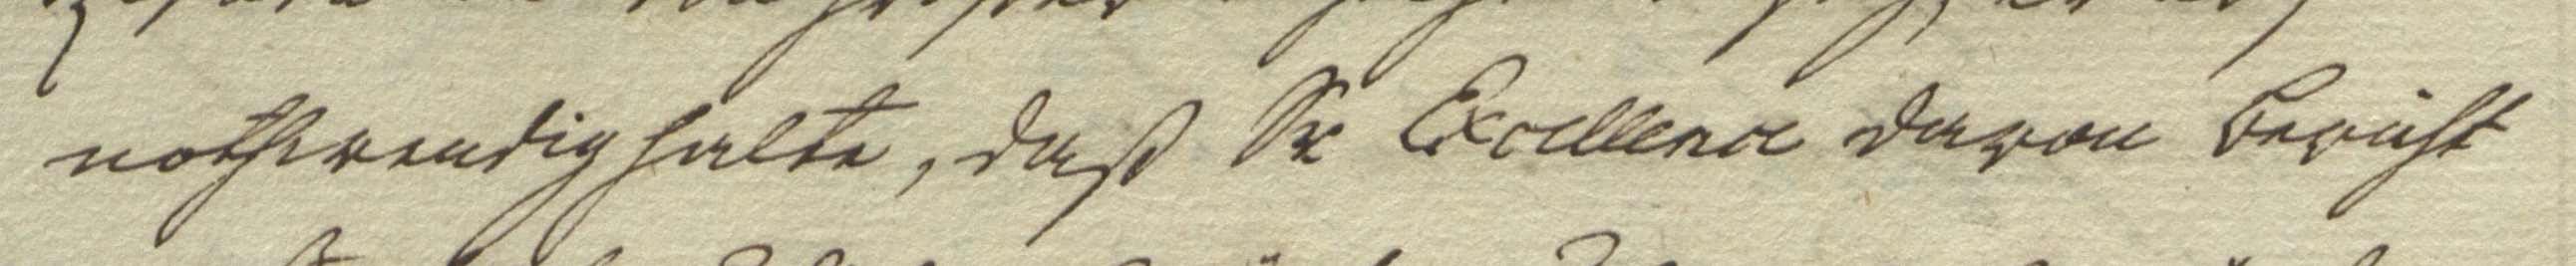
nothwendig halte, daß Sr Excellence davon Bericht
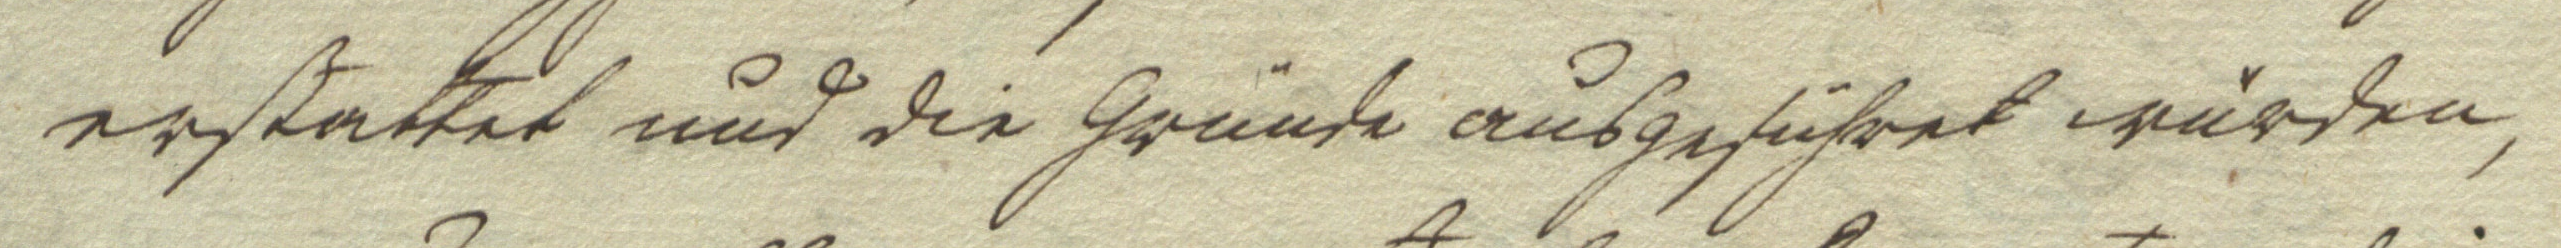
erstattet und die Gründe ausgeführet würden,
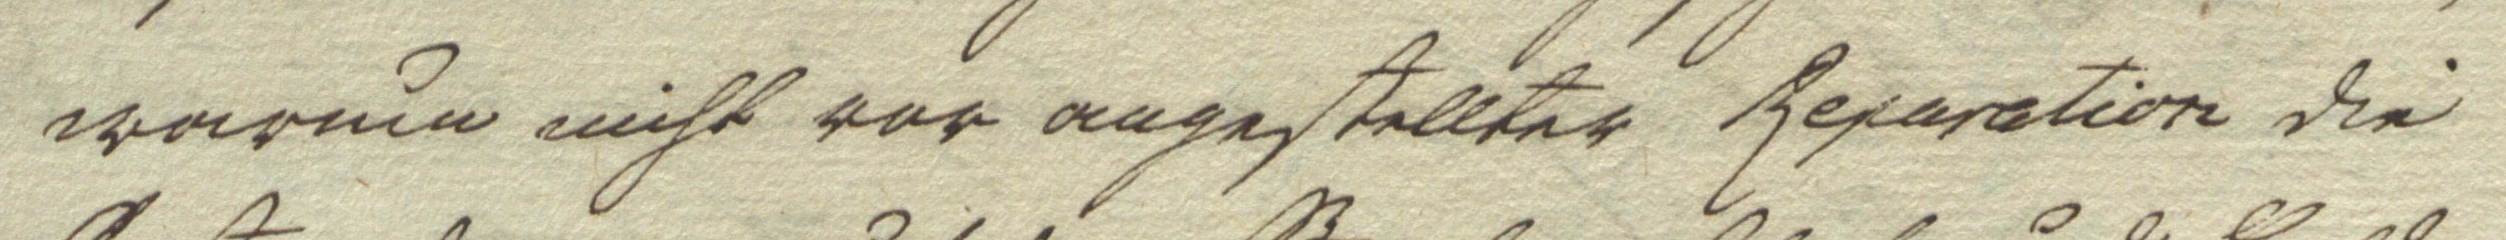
warum nicht vor angestellter Reparation die
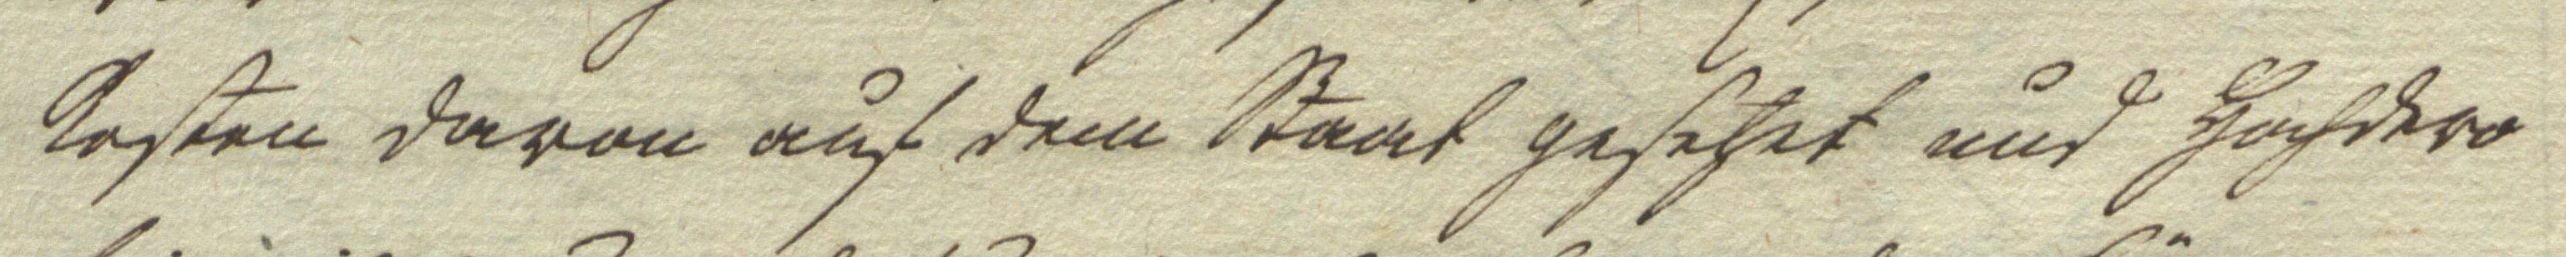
Kosten davon auf dem Staat gesetzet und Hochdero
